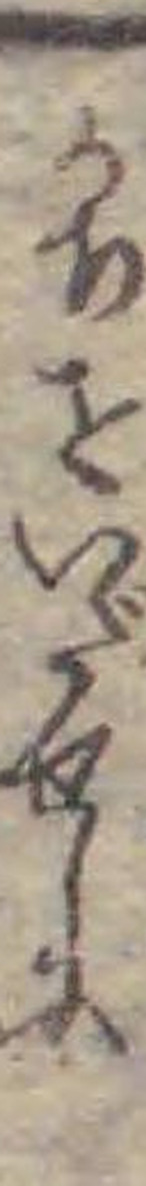かほをいだせしに
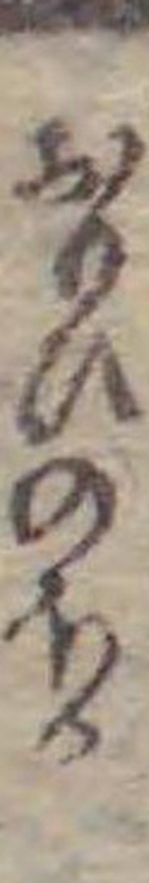おもひのほか
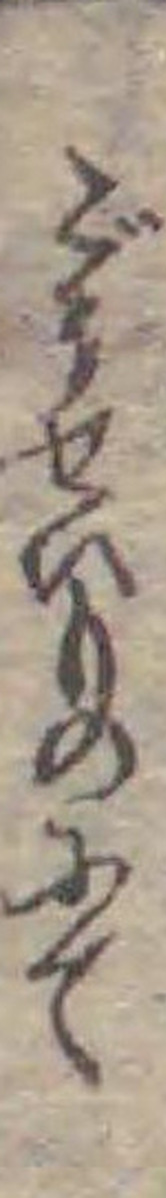ごうせいものにて
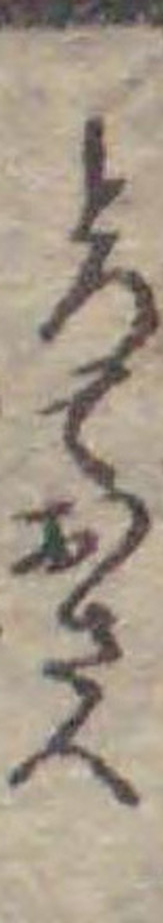とつておさへ
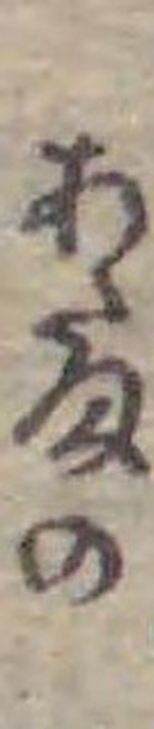あたまの
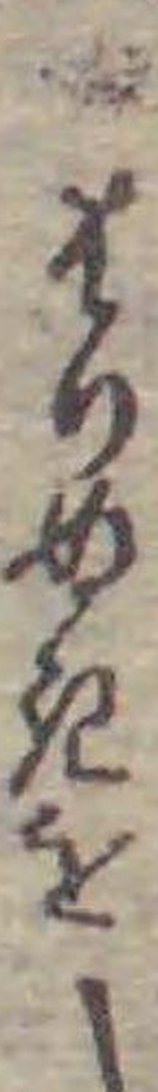はりぬきを
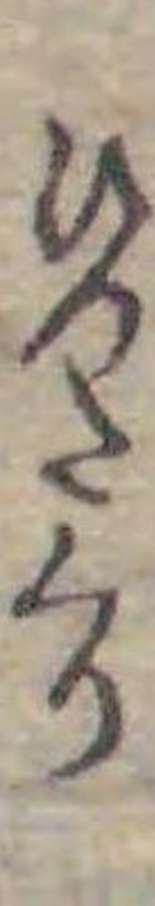ひつたくり
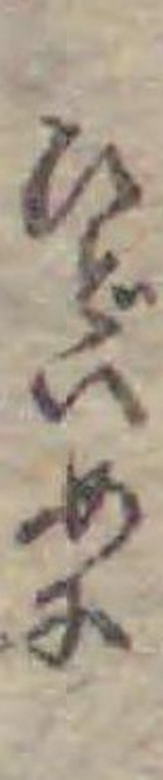ひどいめに

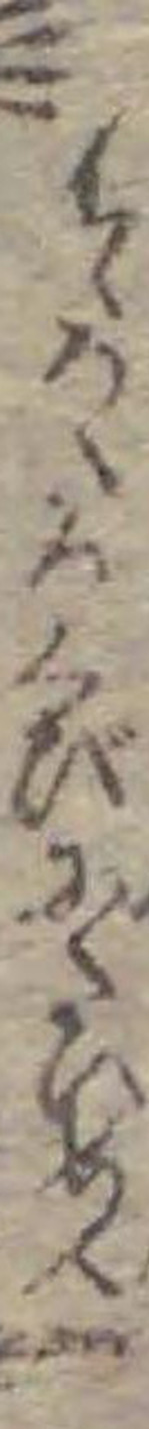はゝくろくろくびにたいめん
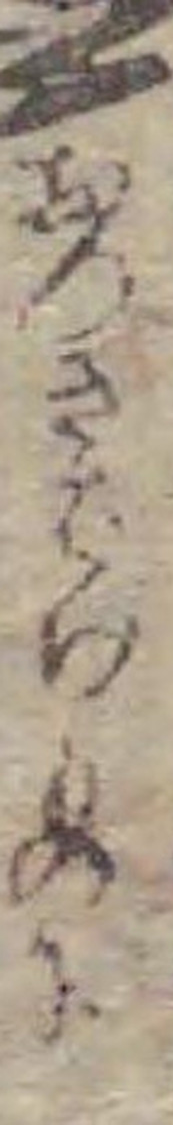おつきはけものに
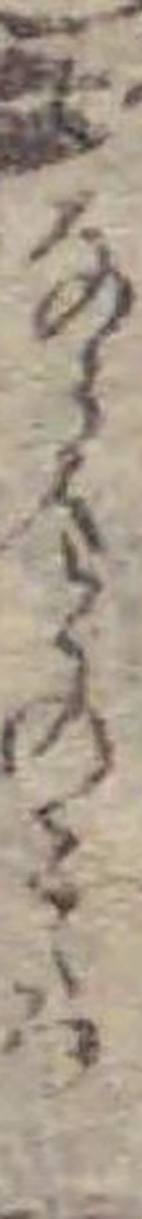ならんとのこゝろ
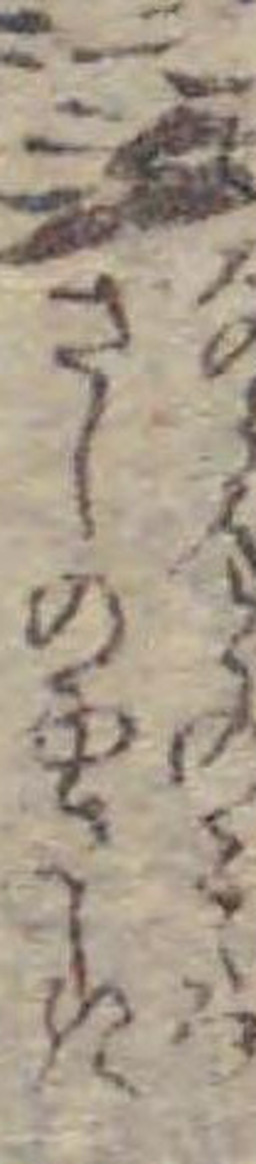さしのやさしき
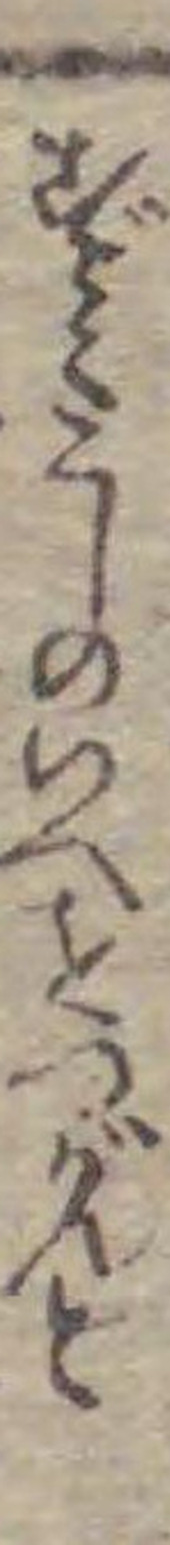ずみこしのいへをつがんと
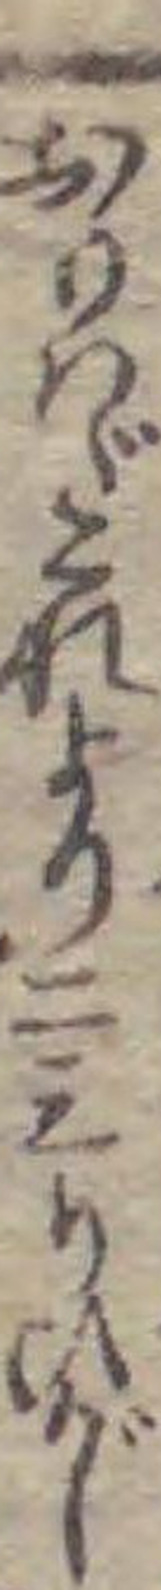おもはゞこれより二三りひがし
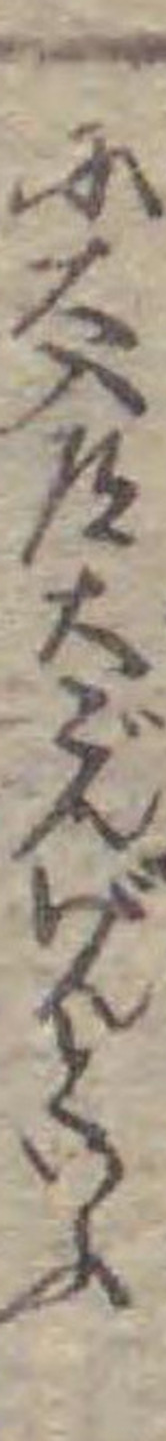に大入道大ごんげんといふ
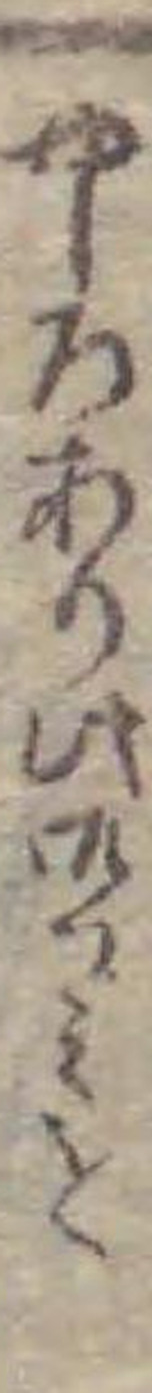やしろあり此御かみを
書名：[化物一代記] : 5巻
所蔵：国立国会図書館 National Diet Library, JAPAN
